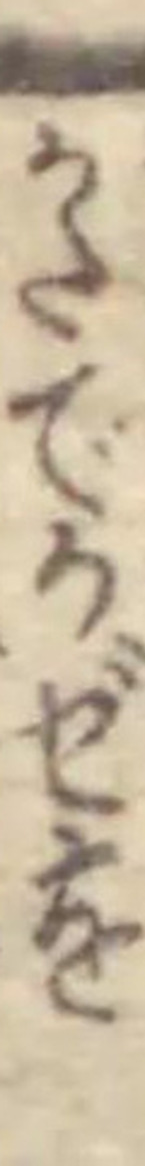かたでかぜを
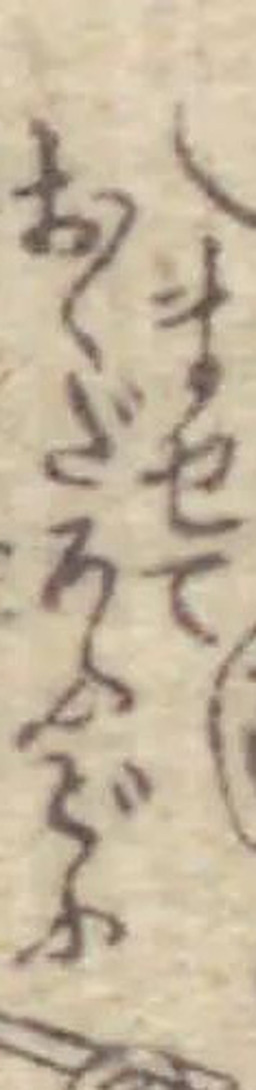おくだろふどふ
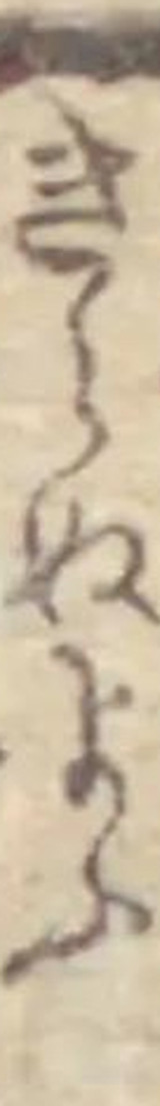きらぬよふ
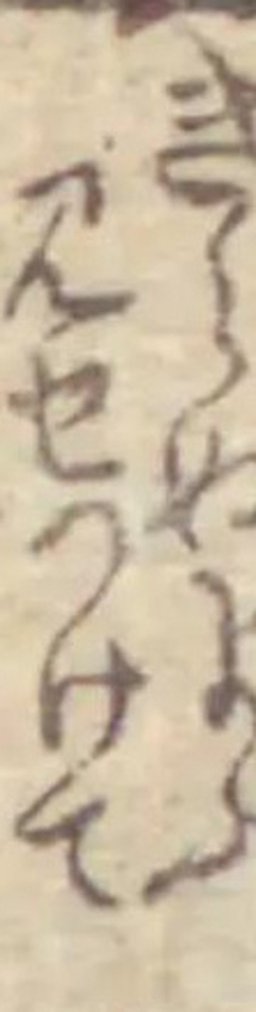見せつけて
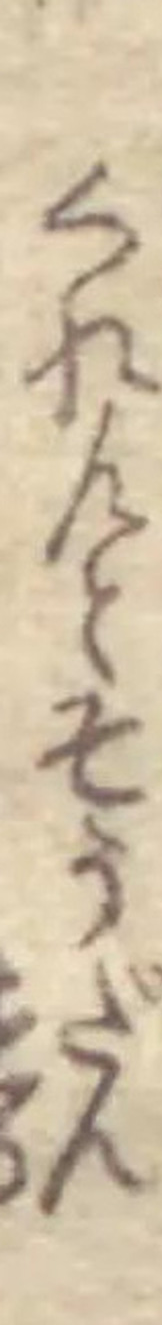くれんとそうだん
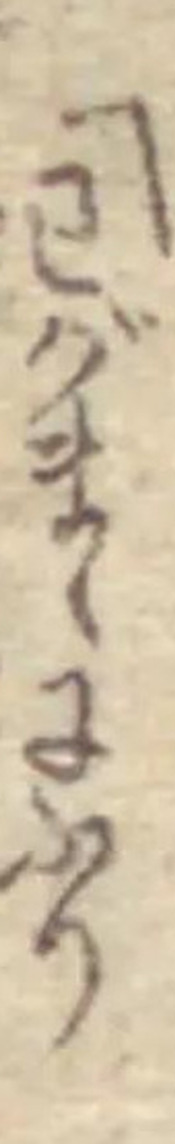〽わがまゝにふり
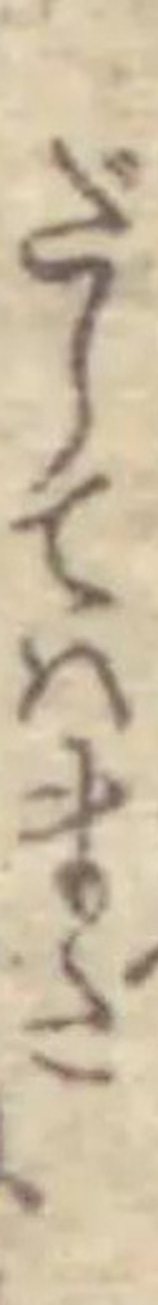だしてはまた
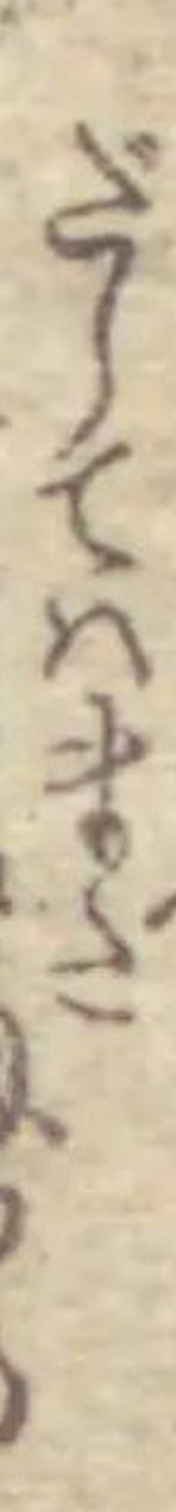だしてはまた
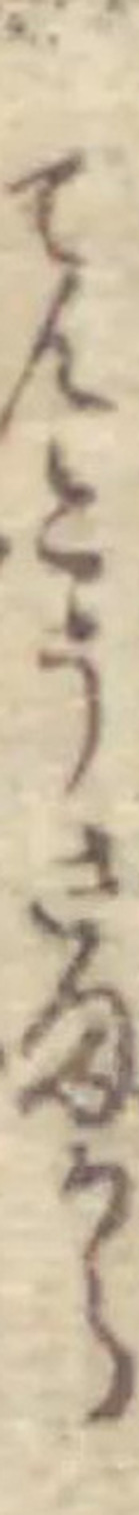てんとうさまから
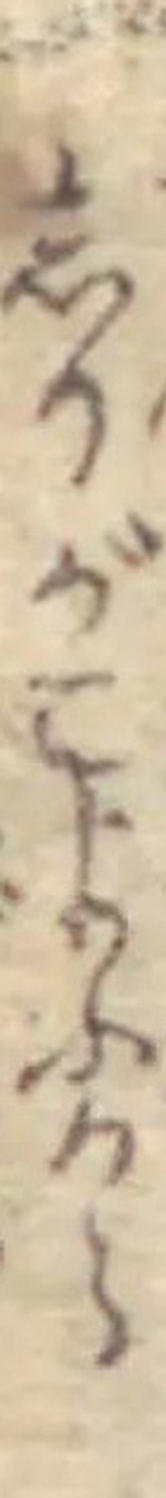しりがこよふから
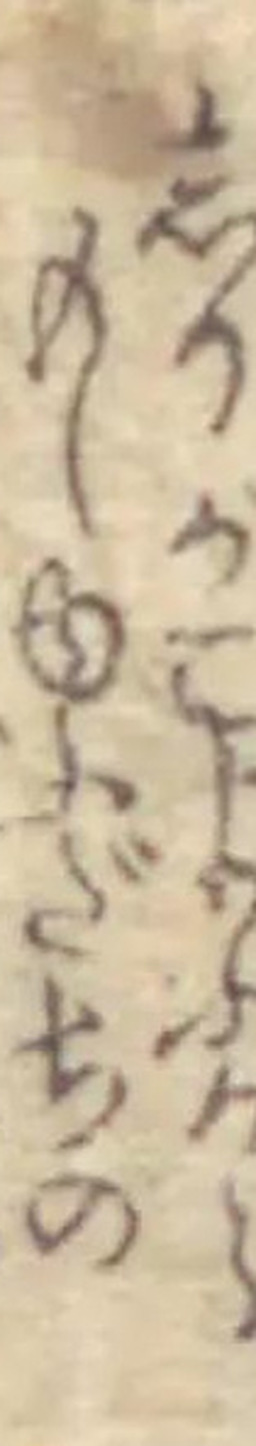もしゆふだちの
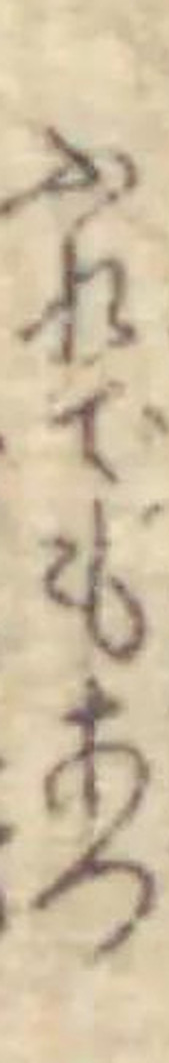ふれでもあつ
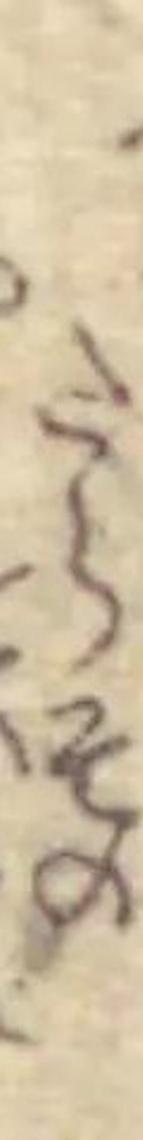たらその
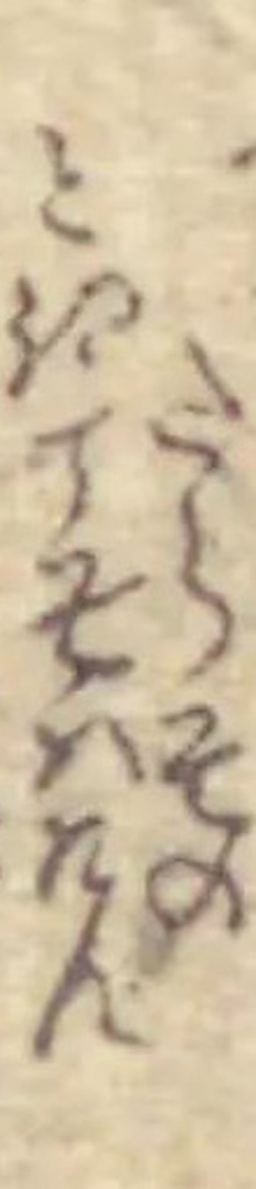ときこそはけん
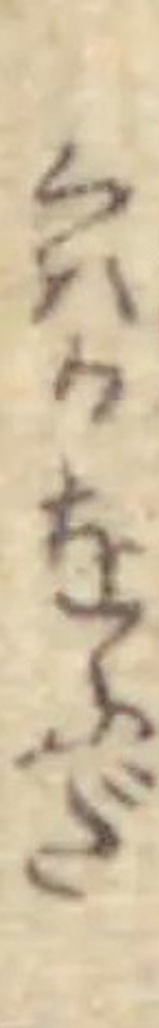くはかをふだ
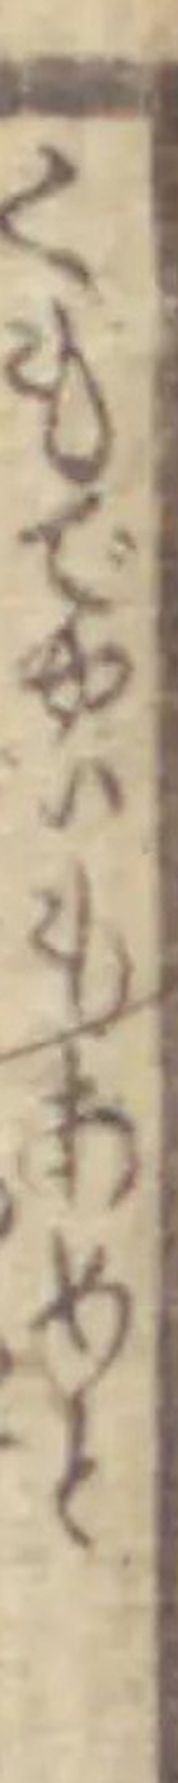くもでやいもあめと
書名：雨宮風宮出儘略縁記 3巻
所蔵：国立国会図書館 National Diet Library, JAPAN
